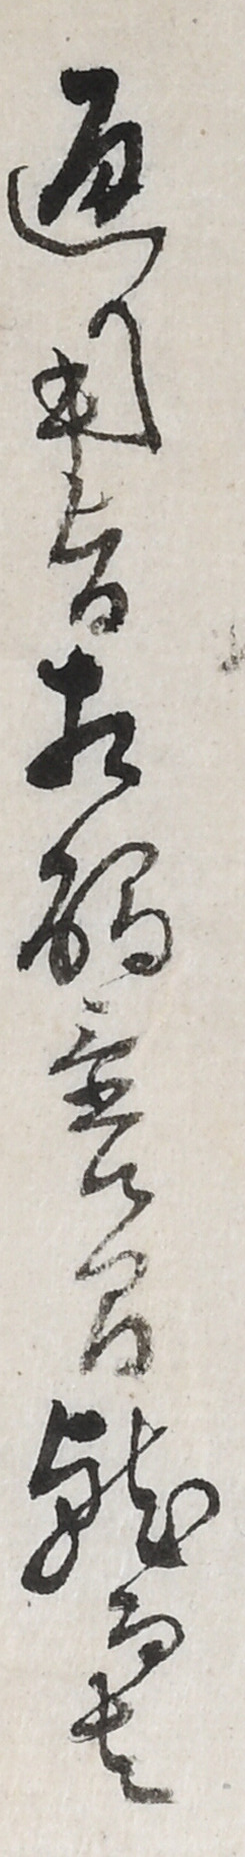通用旨相触置候間就而者
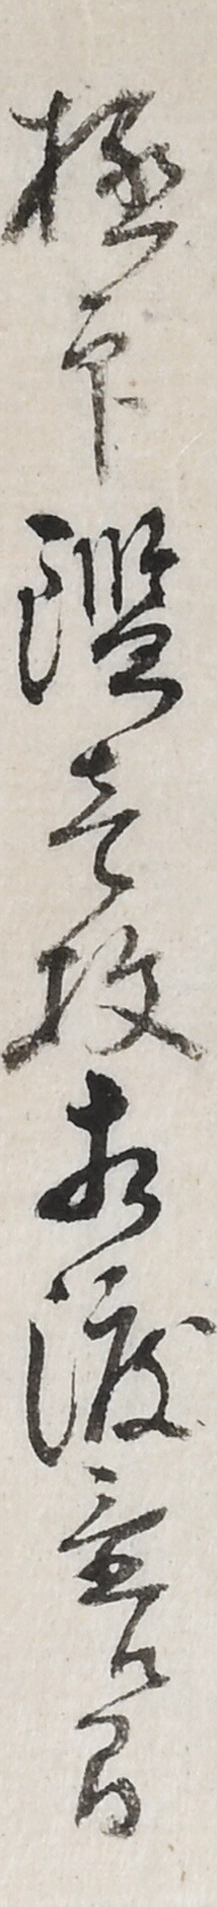極印鑑壱枚相渡置候間
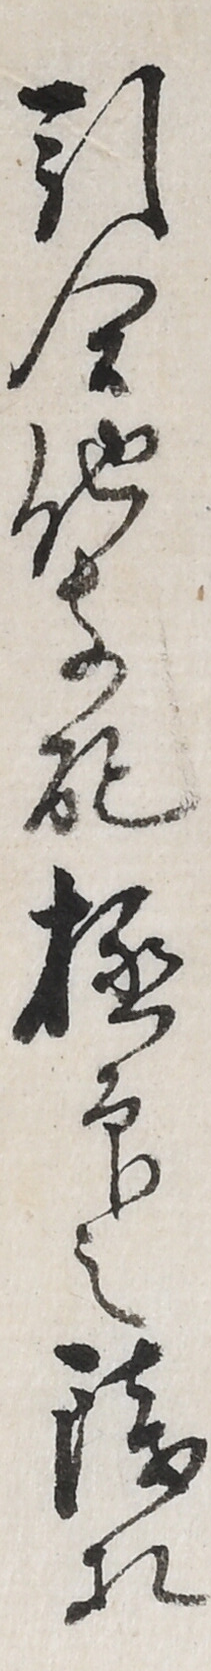引合他支配極印之銭札
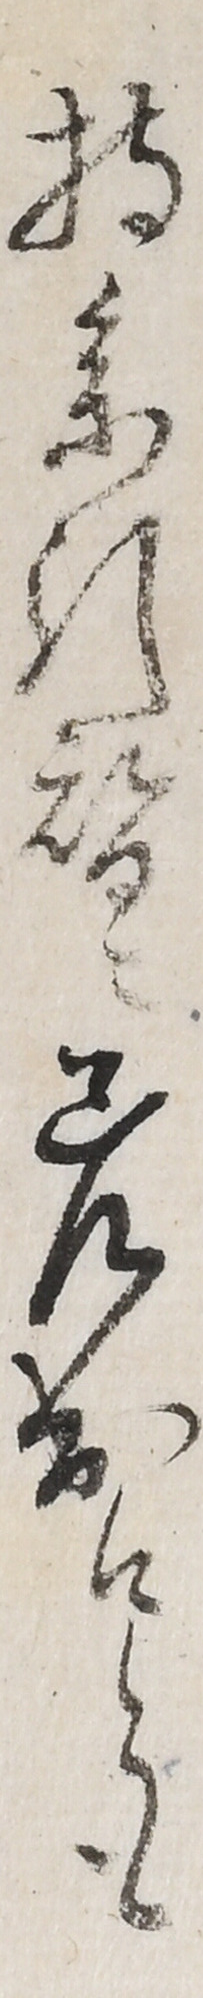持参引替ニ差出候とも
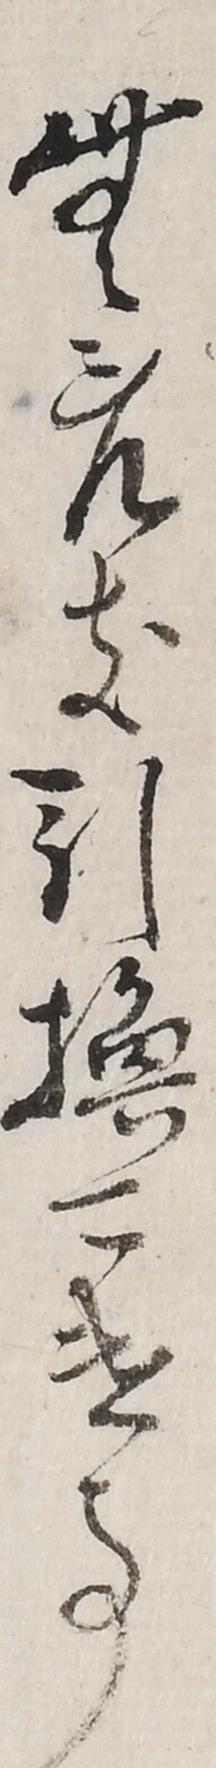無差支引換可遣事
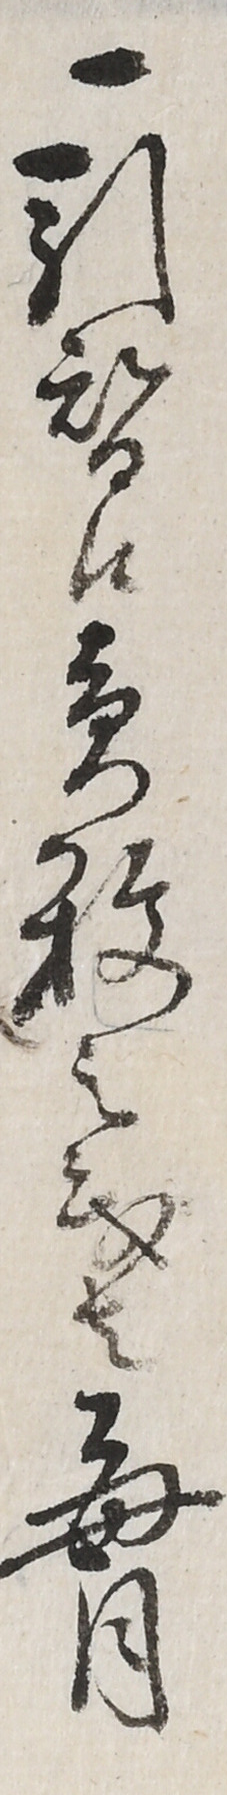一引替候員数之義者毎月
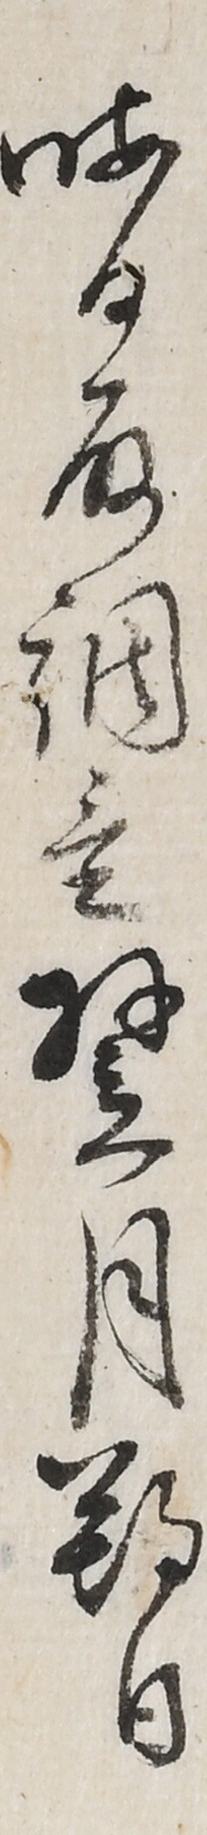晦日取調翌月朔日
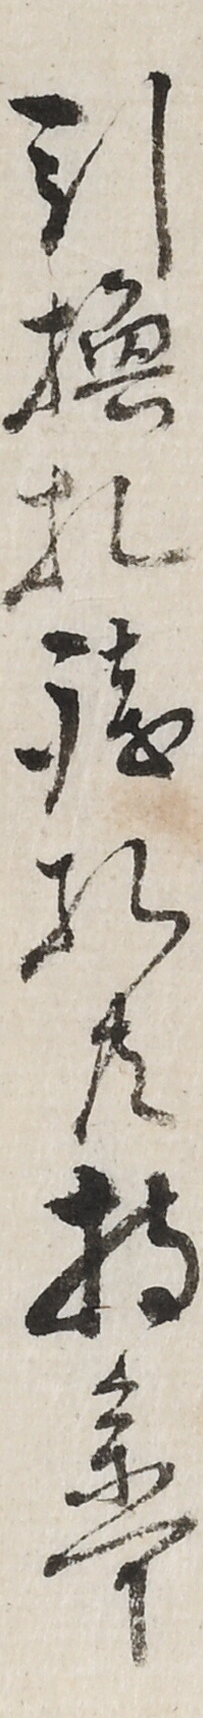引換札銭札共持参可
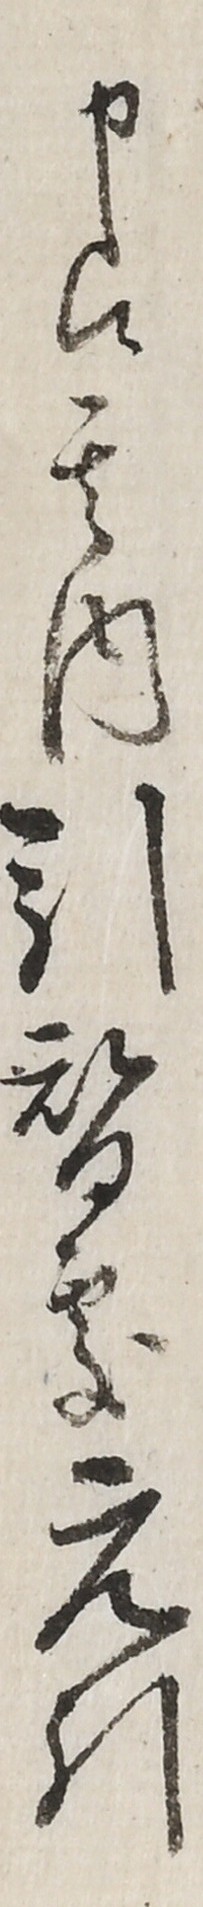申候其内引替処元引
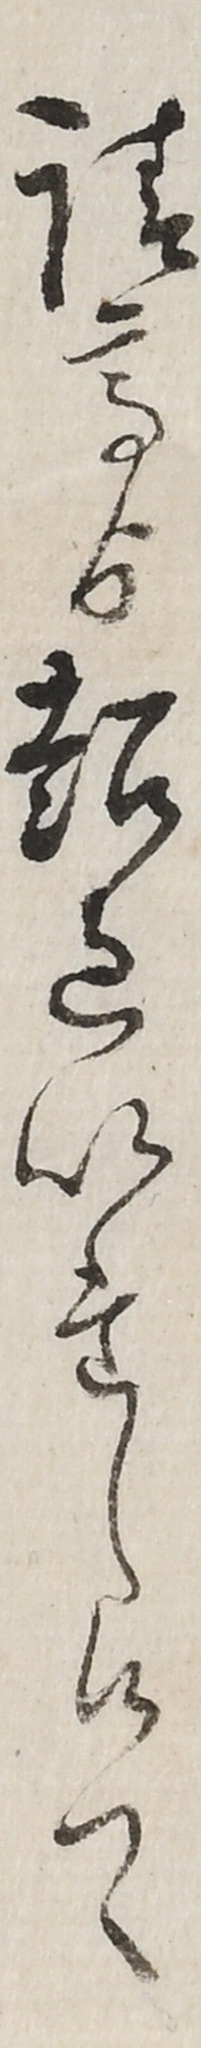請高ゟ超過いたし候ハヽ
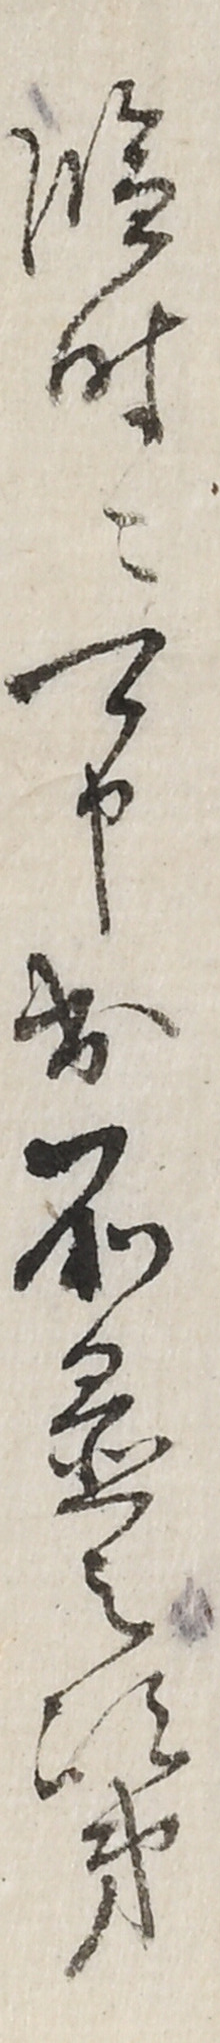臨時ニ可申出所置之次第
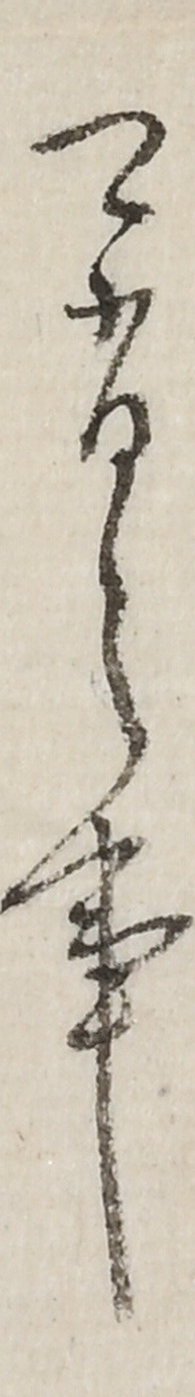可有之事
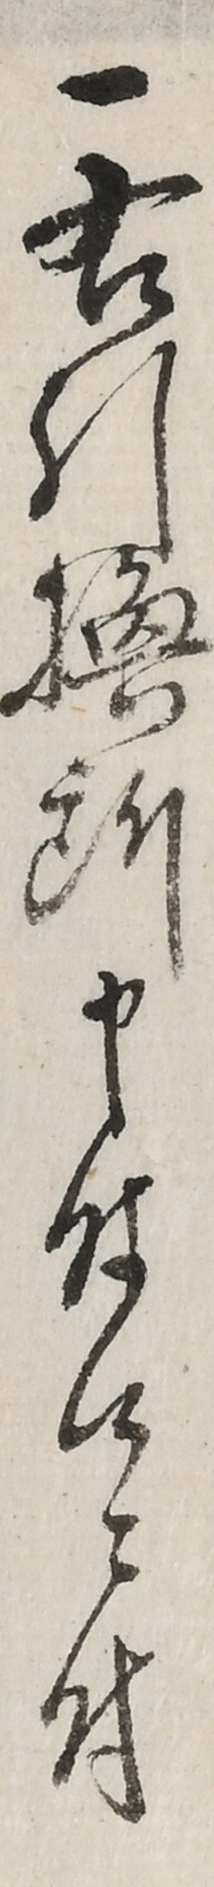一右引換所申付候ニ付

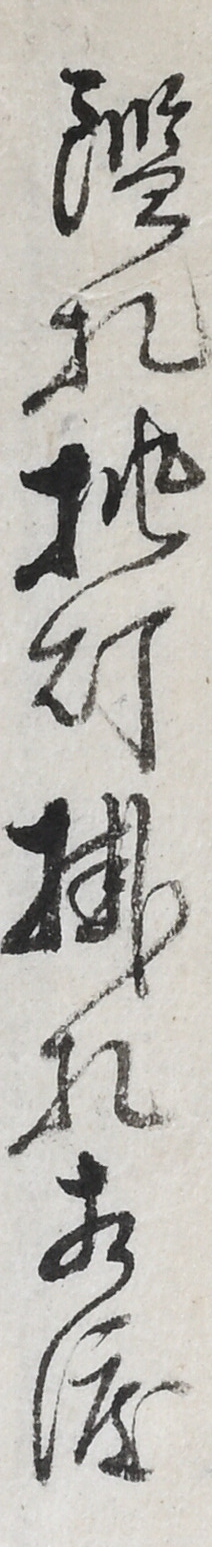鑑札挑灯掛札相渡
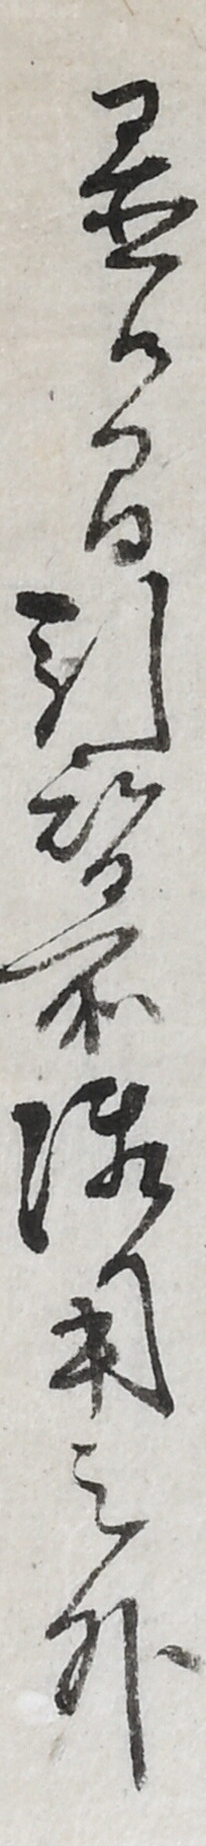置候間引替所御用之外
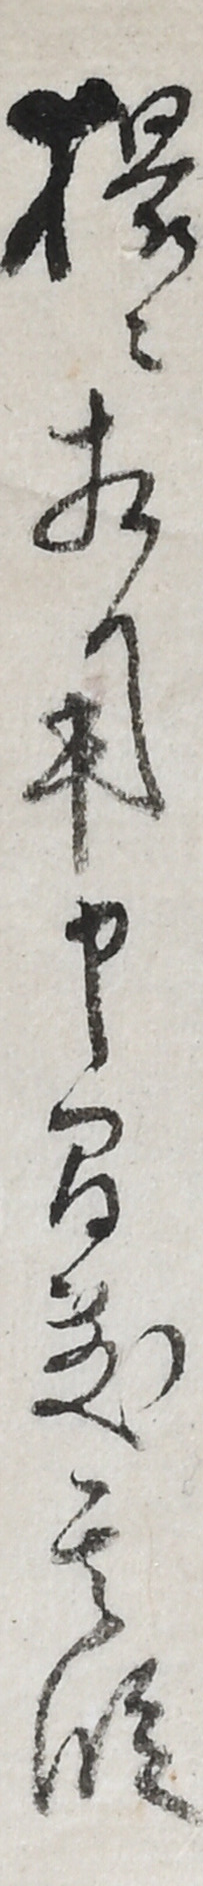猥ニ相用申間敷其段
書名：信濃全國楮幣引換御用控
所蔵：伊那市立高遠町図書館・合同会社AMANE
